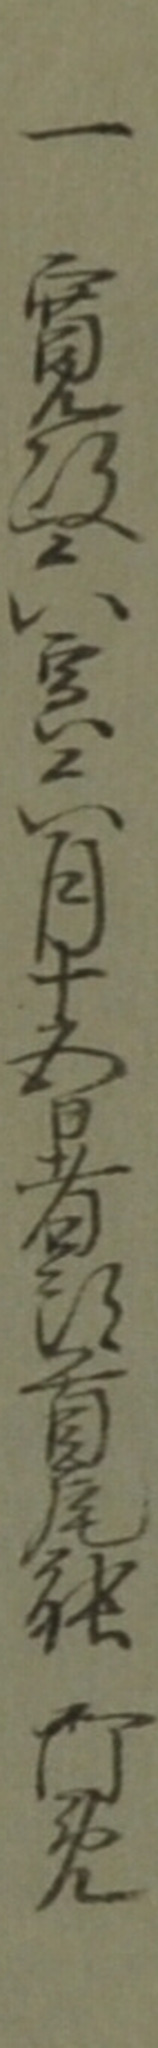一寛政六寅六月十五日者頭首尾能御免
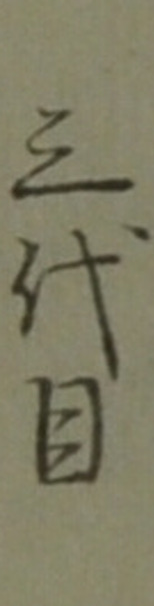三代目
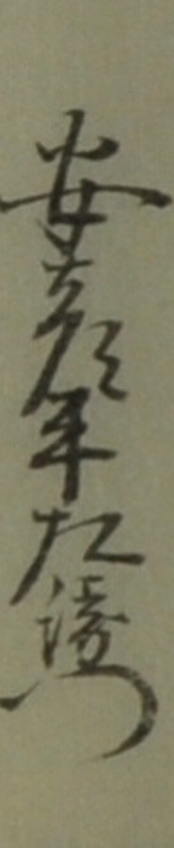安彦平左衛門
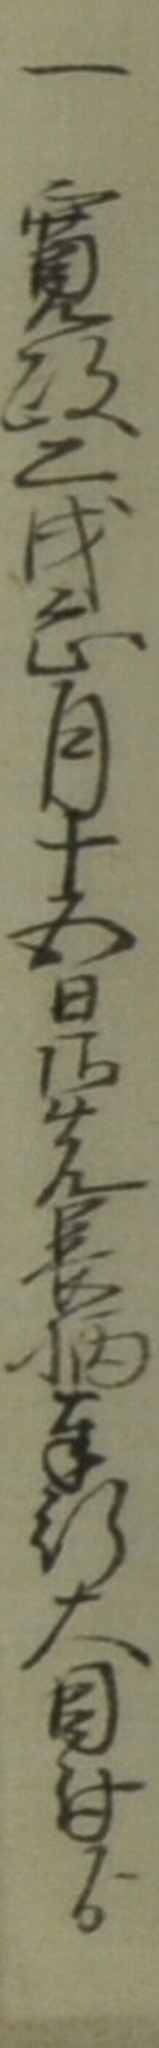一寛政二戌正月十五日御先長柄奉行大目付ゟ

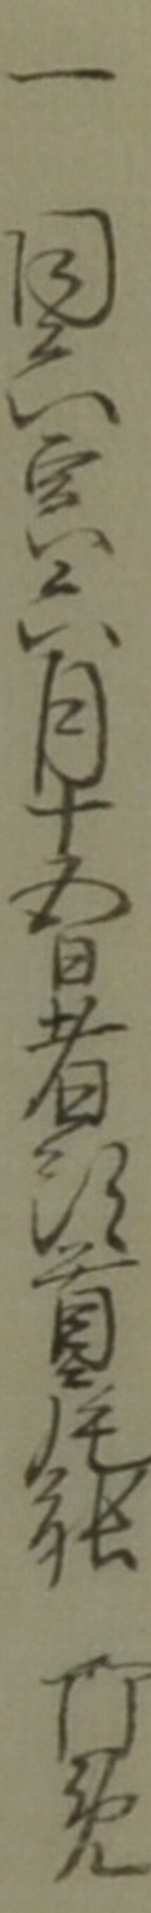一同六寅六月十五日者頭首尾能御免
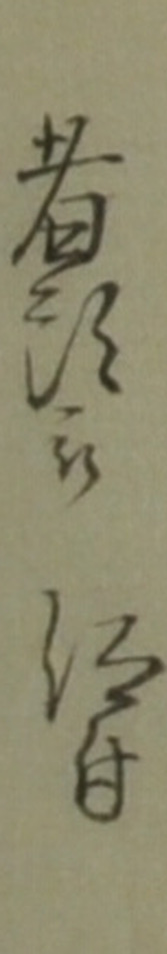者頭被仰付
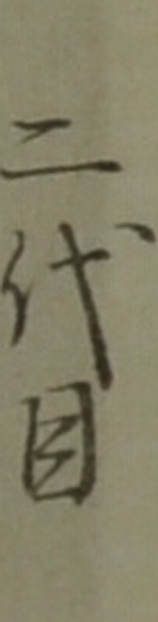二代目
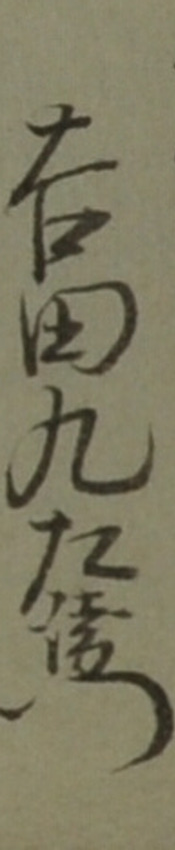吉田九左衛門
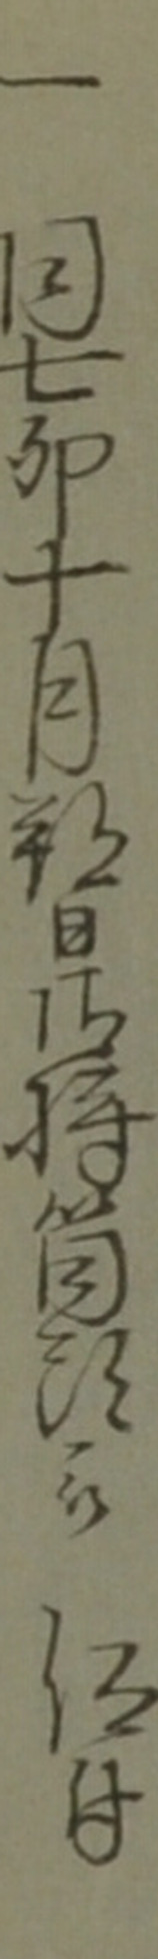一同七卯十月朔日御持筒頭被仰付
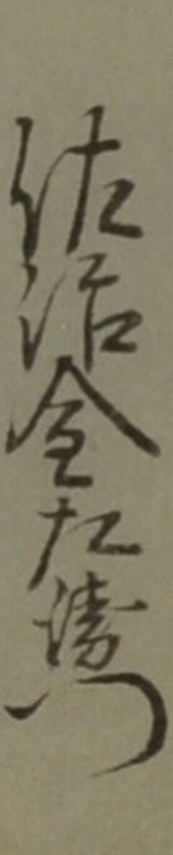佐治金左衛門
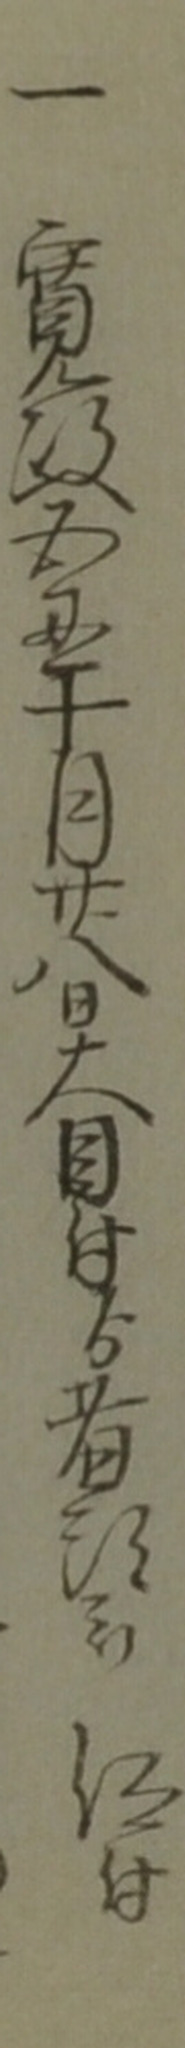一寛政五丑十月廿八日大目付ゟ者頭被仰付
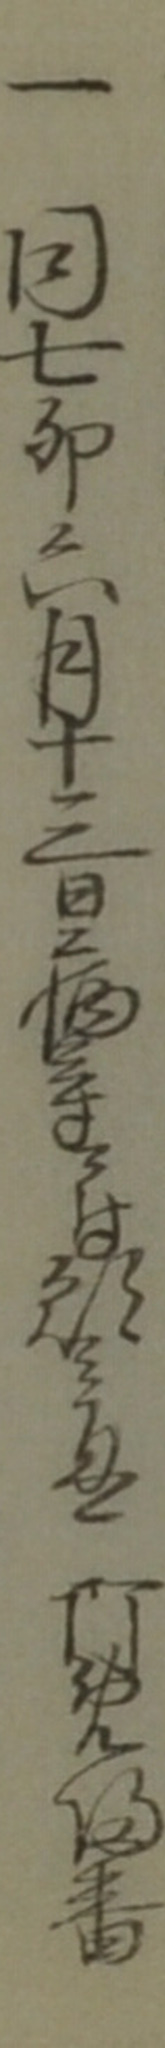一同七卯六月十三日病気ニ付願之通御免帰番
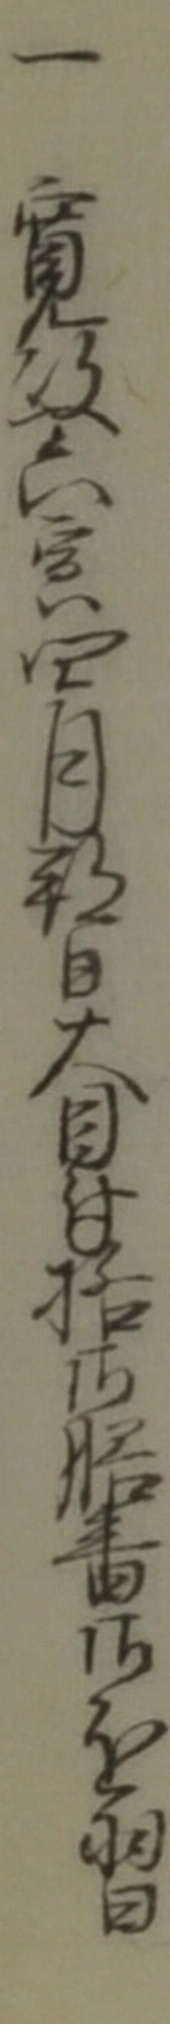一寛政六寅四月朔日大目付格御膳番御世習
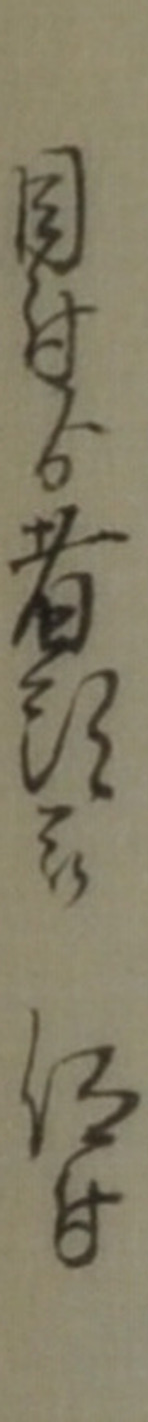目付ゟ者頭被仰付
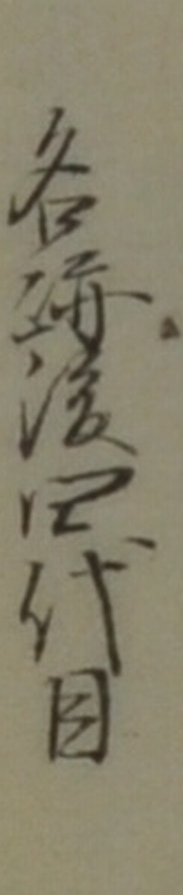名跡後四代目
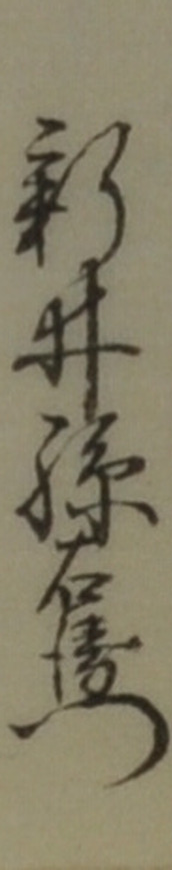新井孫右衛門
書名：諸御役代々録（二）
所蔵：伊那市立高遠町図書館・合同会社AMANE
